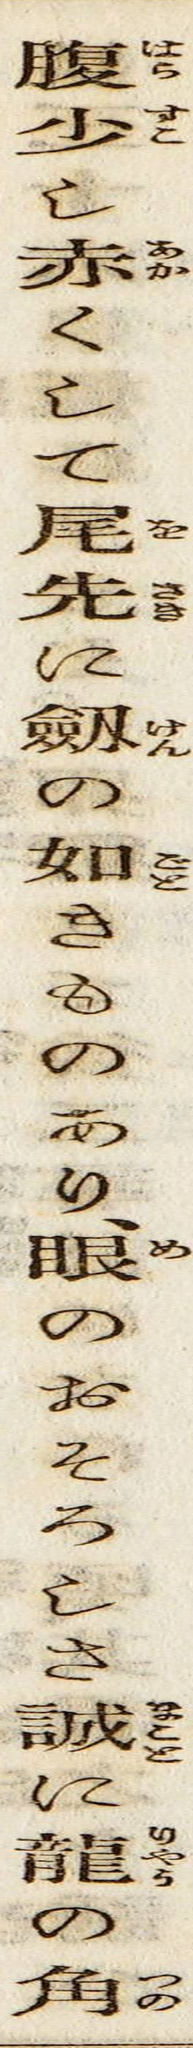腹少し赤くして尾先に剣の如きものあり、眼のおそろしさ誠に竜の角
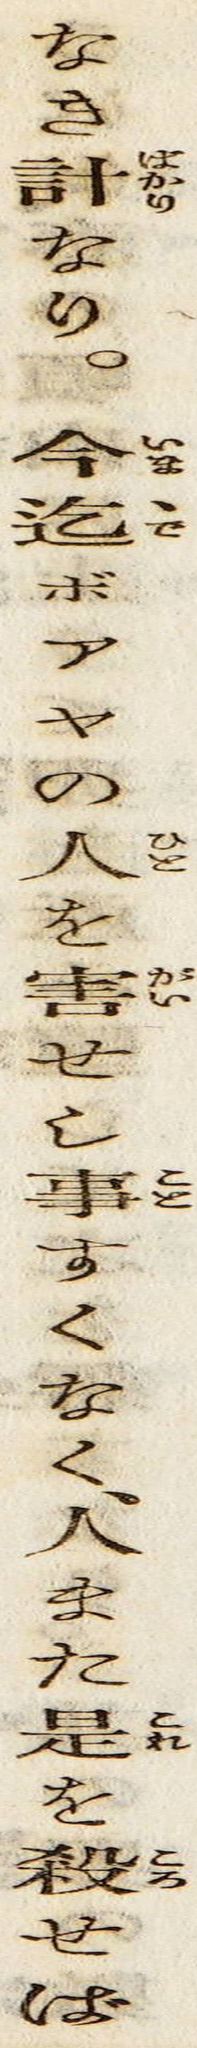なき計なり。今迄ボアヤの人を害せし事すくなく、人また是を殺せば
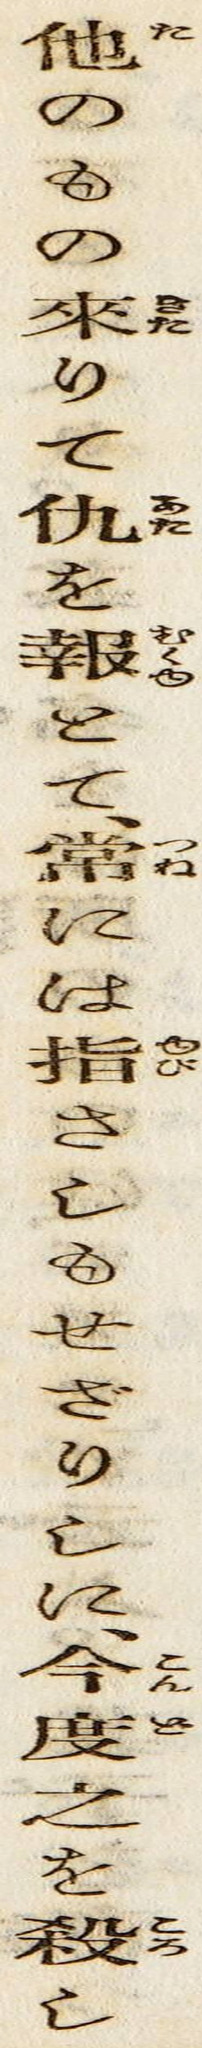他のもの来りて仇を報とて、常には指さしもせざりしに、今度之を殺し
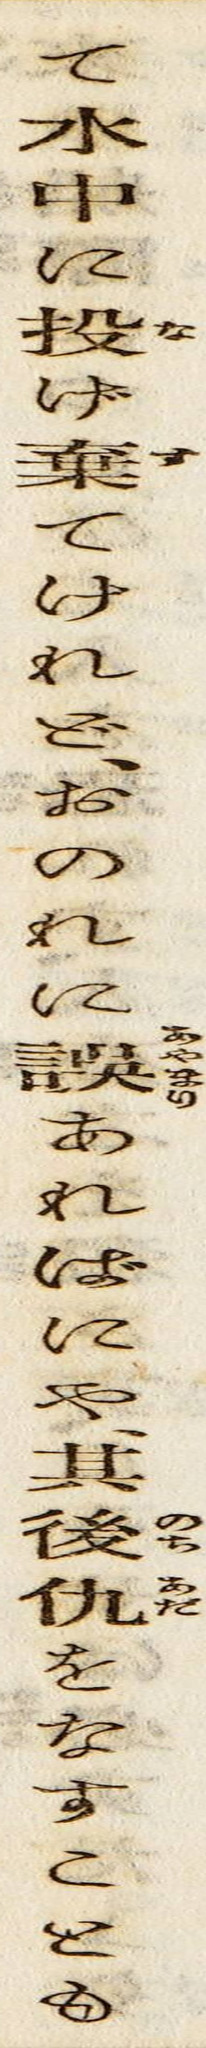て水中に投げ棄てけれど、おのれに誤あればにや、其後仇をなすことも
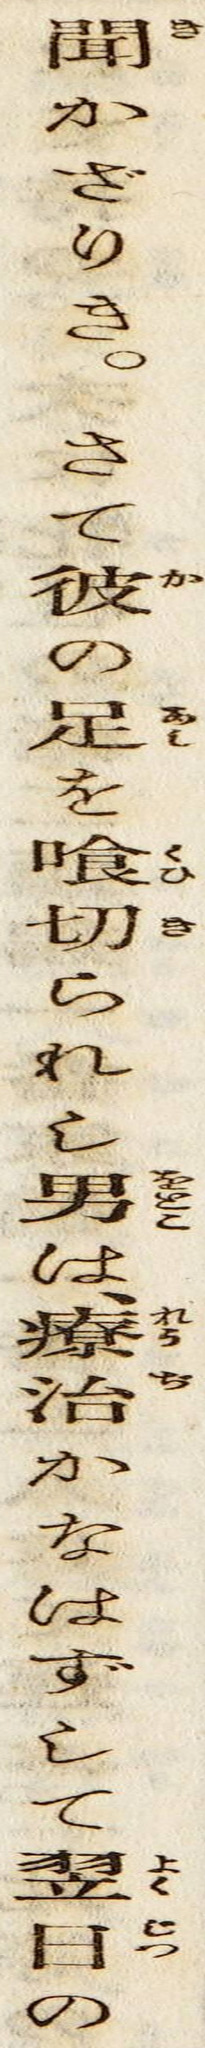聞かざりき。さて彼の足を喰切られし男は、療治かなはずして翌日の
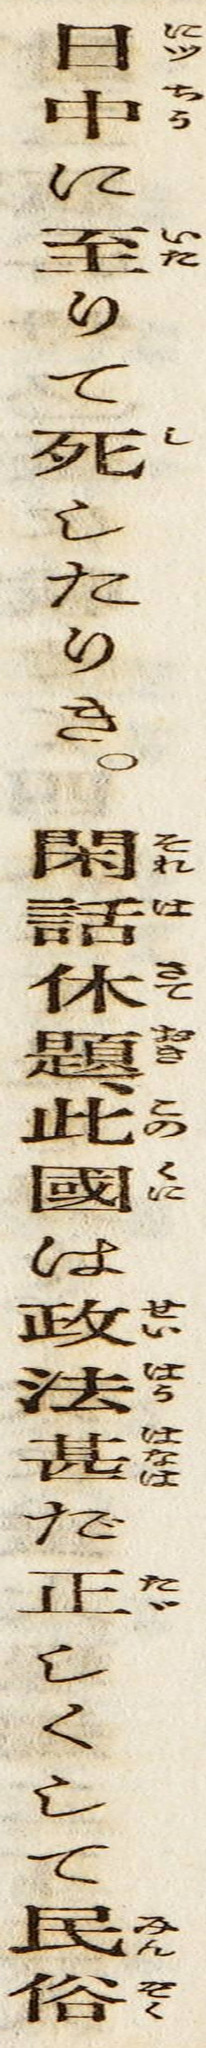日中に至りて死したりき。閑話休題、此国は政法甚だ正しくして民俗
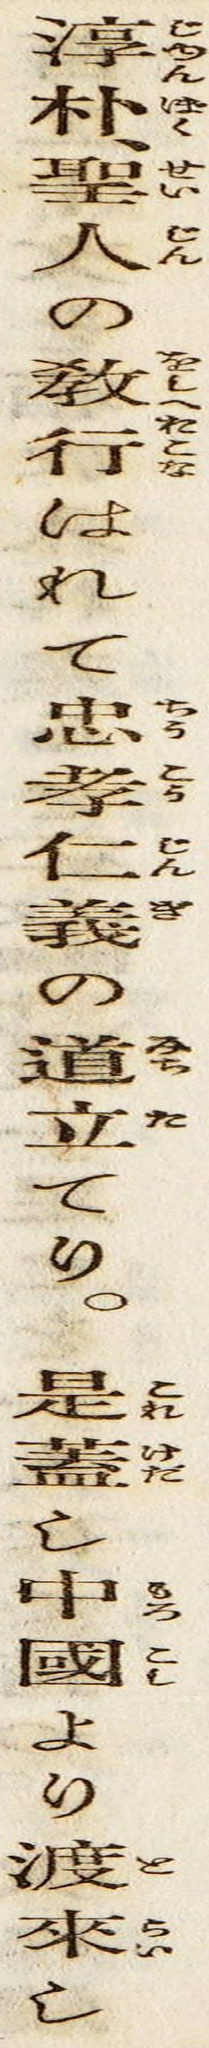淳朴、聖人の教行はれて忠孝仁義の道立てり。是蓋し中国より渡来し
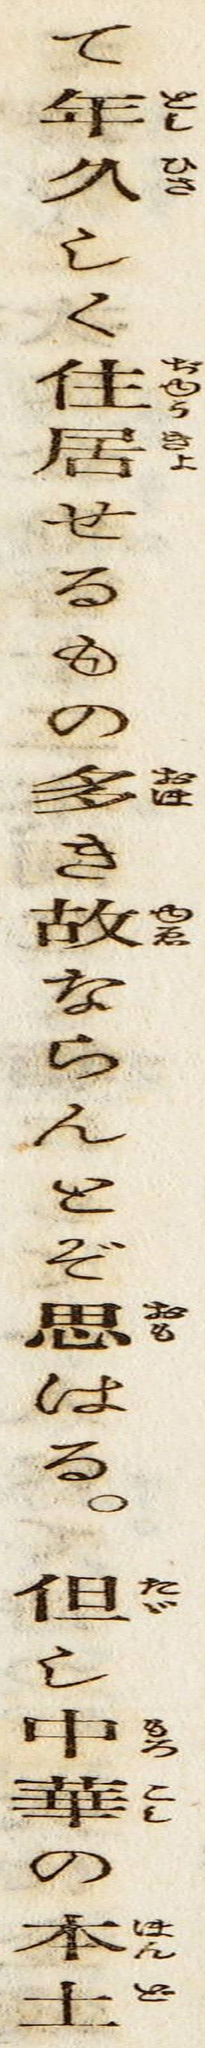て年久しく住居せるもの多き故ならんとぞ思はる。但し中華の本土
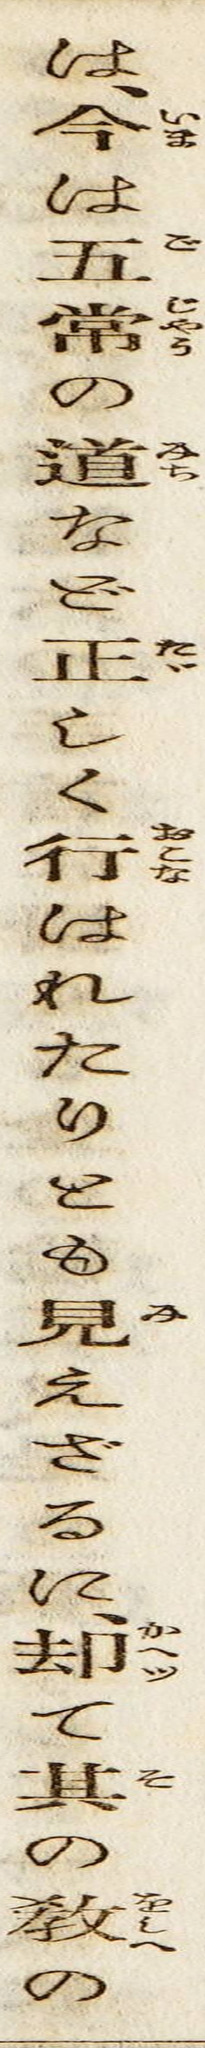は、今は五常の道など正しく行はれたりとも見えざるに、却て其の教の
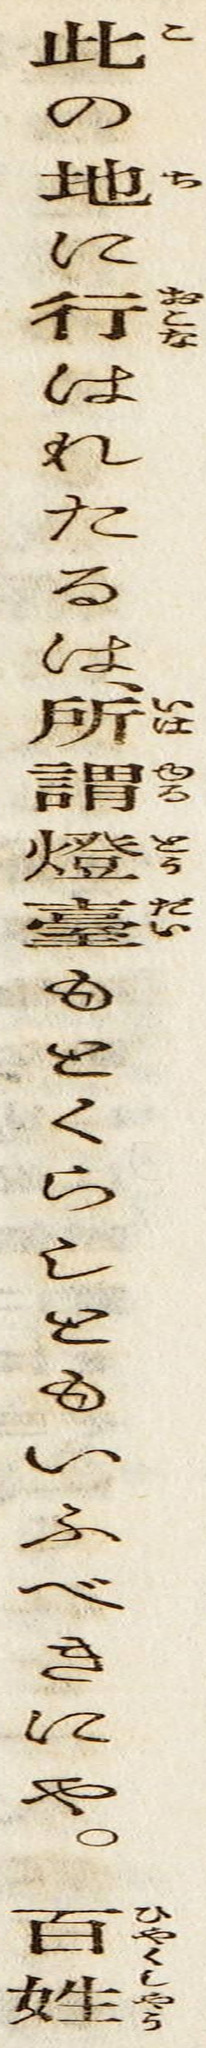此の地に行はれたるは、所謂灯台もとくらしともいふべきにや。百姓
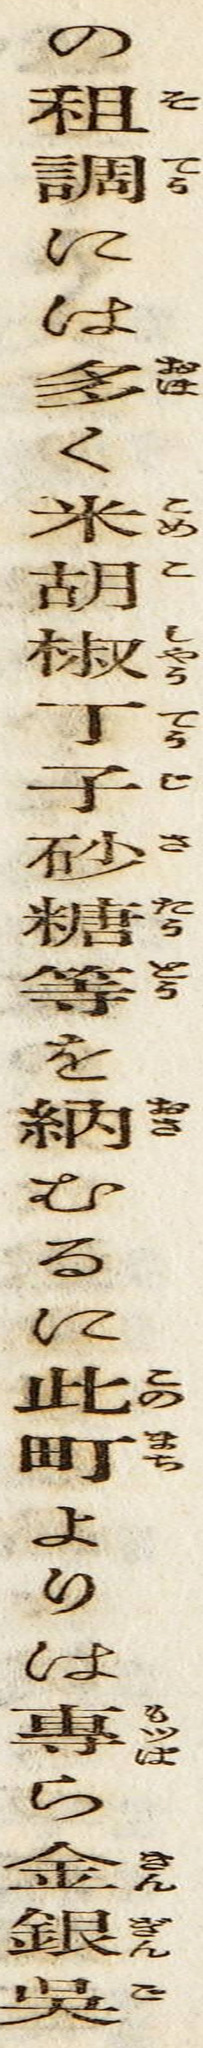の租調には多く米胡椒丁子砂糖等を納むるに此町よりは専任ら金銀呉
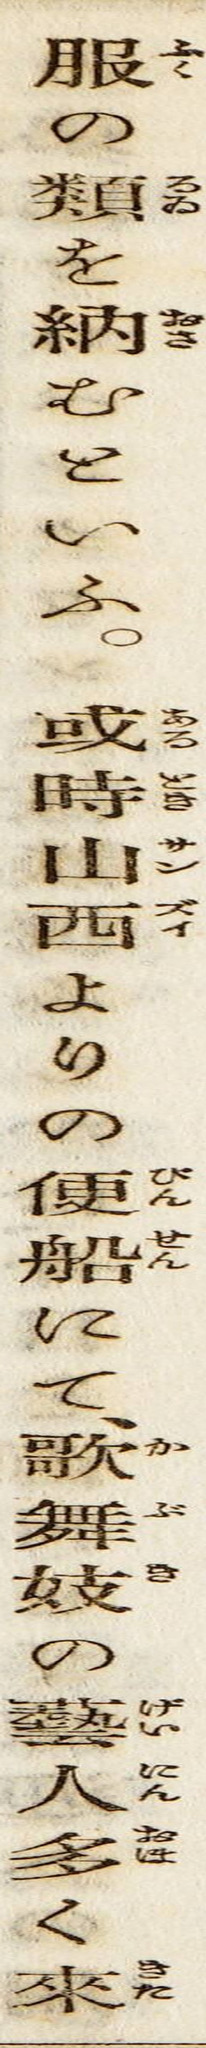服の類を納むといふ。或時山西よりの便船にて、歌舞伎の芸人多く来
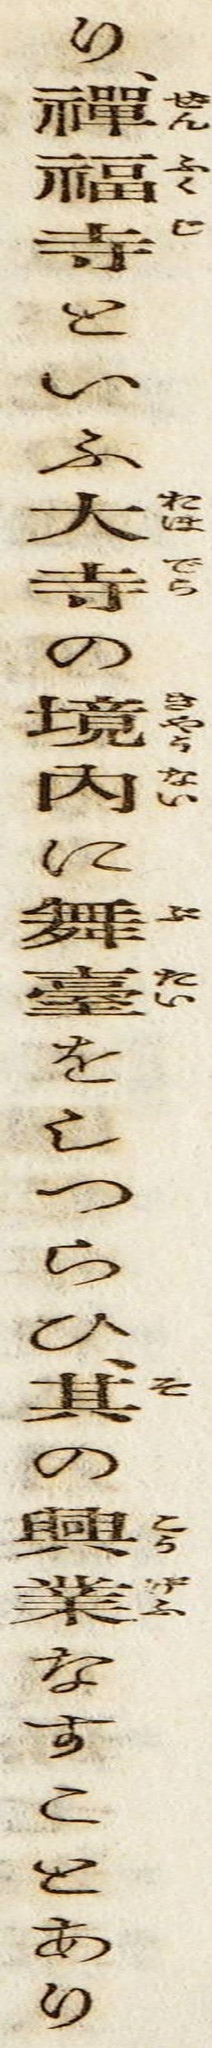り、禅福寺といふ大寺の境内に舞台をしつらひ、其の興業なすことあり
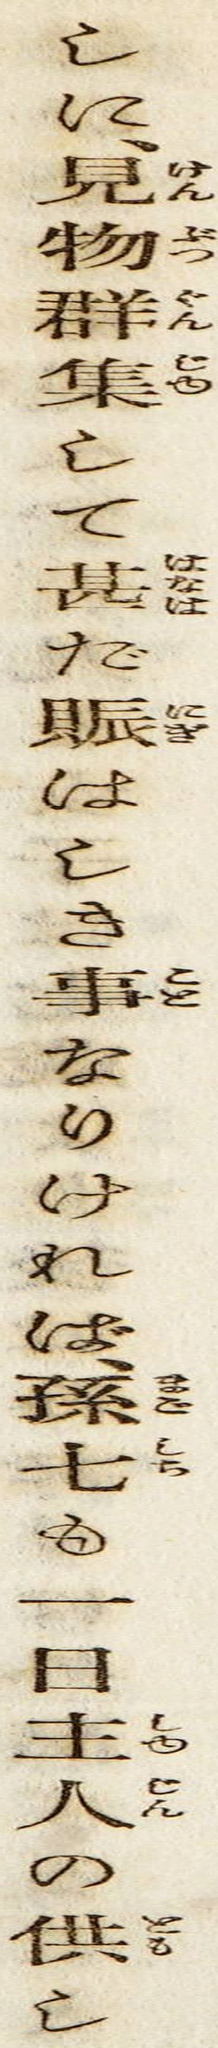しに、見物群集して甚だ賑はしき事なりければ、孫七も一日主人の供し
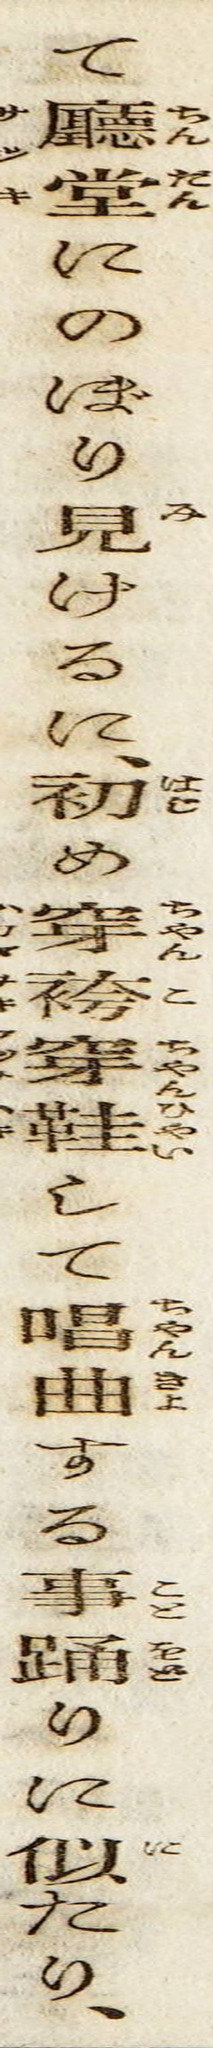て庁堂にのぼり見けるに、初め穿袴穿鞋して唱曲する事踊りに似たり、

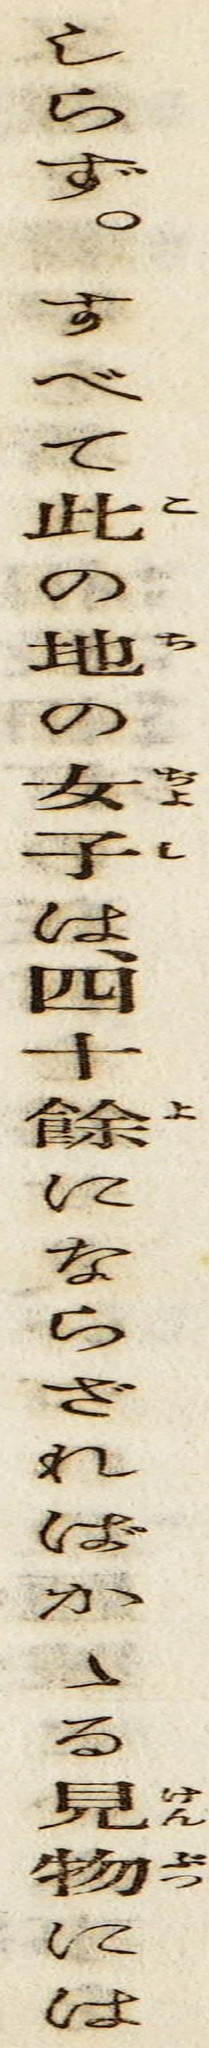しらず。すべて此の地の女子は、四十余にならざればかゝる見物には
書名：日本漂流譚
